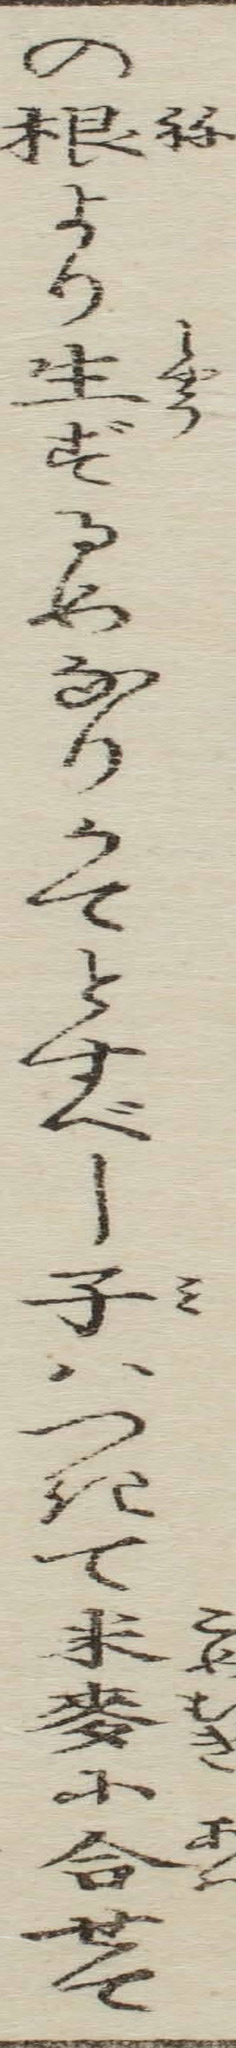の根より生ずるめなりかてとすべし子はつきて米麦に合せて
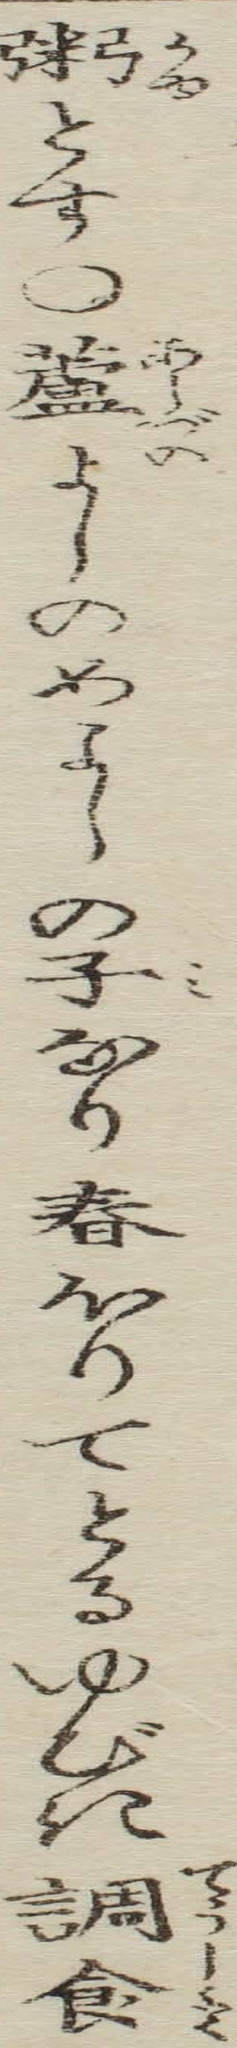粥とす○蘆よしのめよしの子なり春ほりてとるゆびき調食
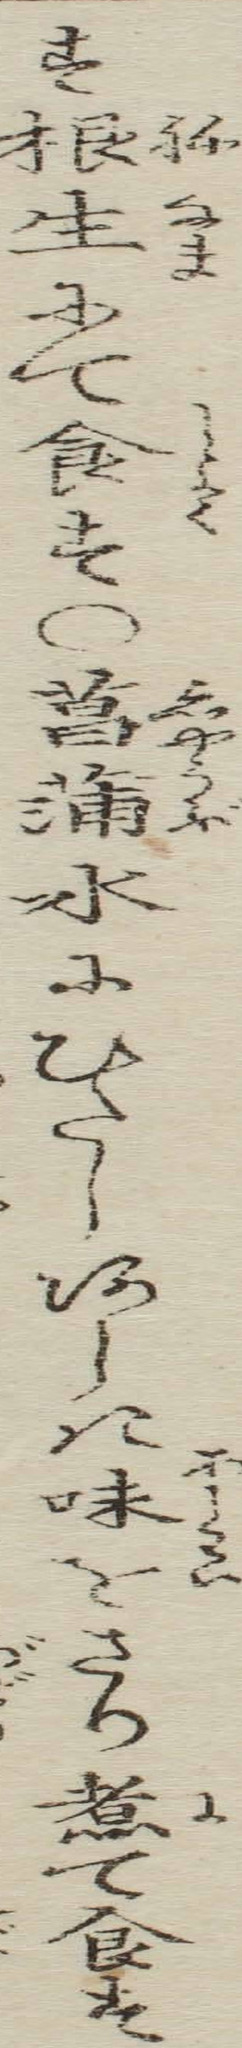す根生にて食す○菖蒲水にひたしあしき味をさり煮て食す
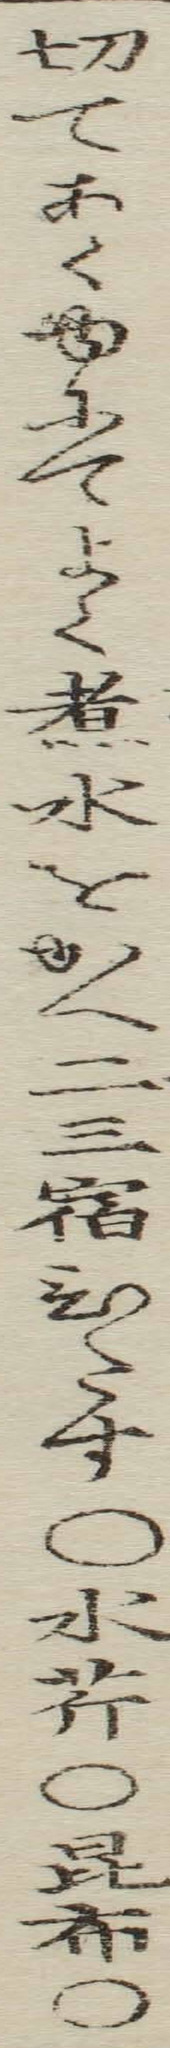切てあくゆにてよく煮水をかへ二三宿ひたす○水芹○昆布○

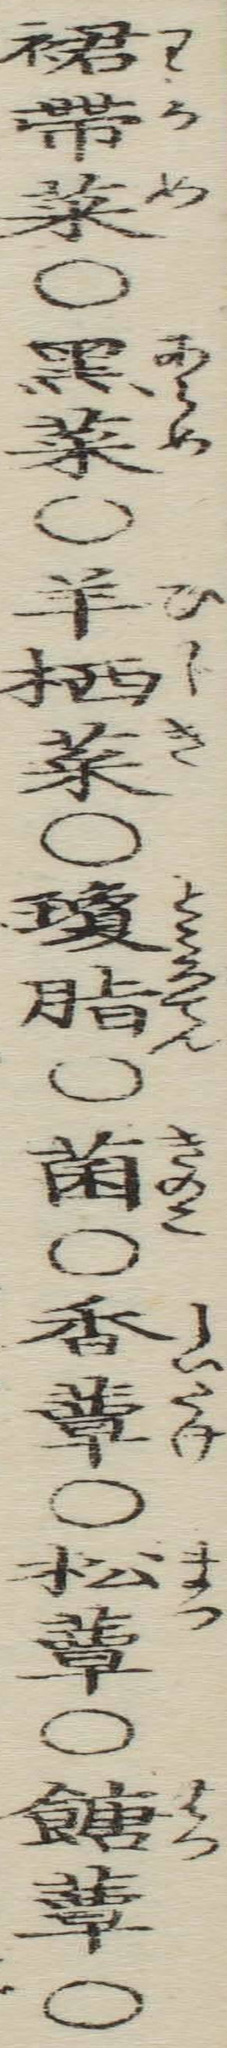裙帯菜○黒菜○羊栖菜○瓊脂○菌○香蕈○松蕈○餹蕈○
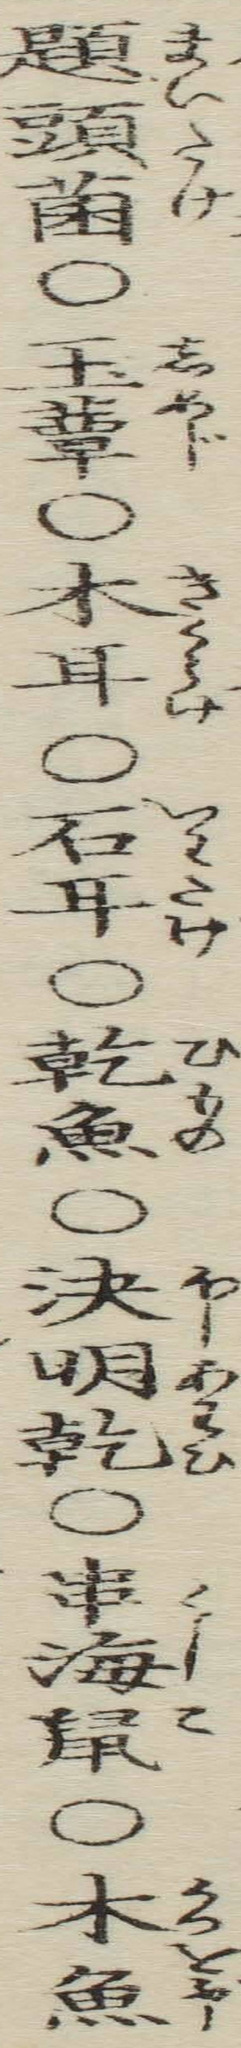題頭菌○玉蕈○木耳○石耳○乾魚○決明乾○串海䑕○木魚
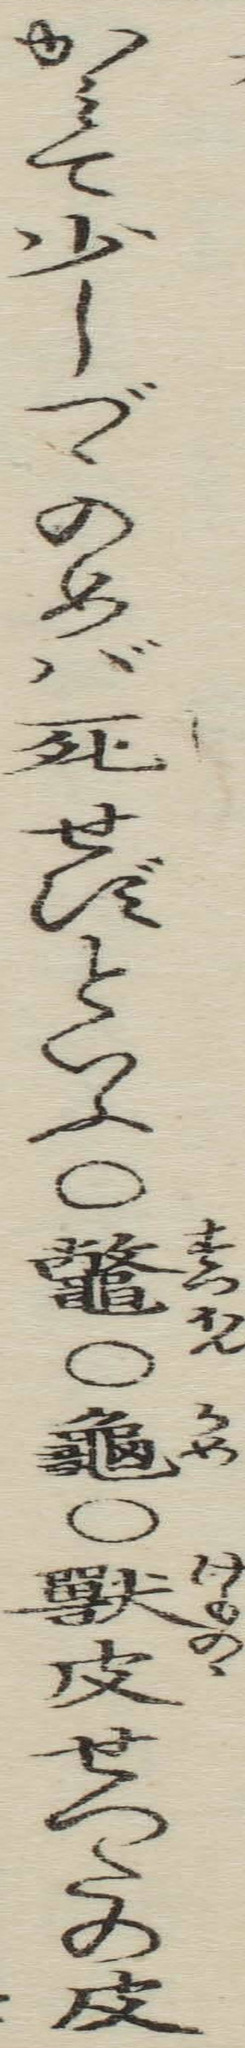かみて少しづゝのめば死せずといふ○鼈○亀○獣皮せつたの皮
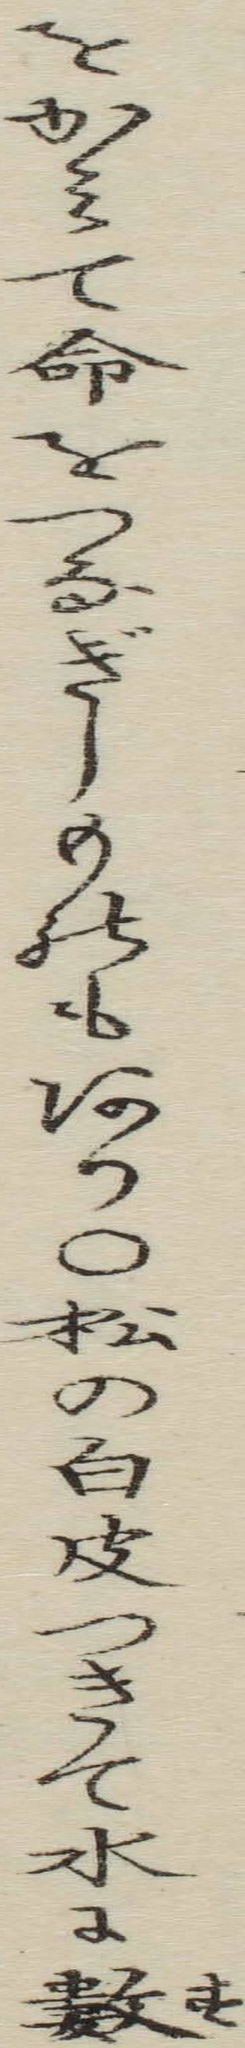をかみて命をつなぎしものもあり○松の白皮つきて水に数
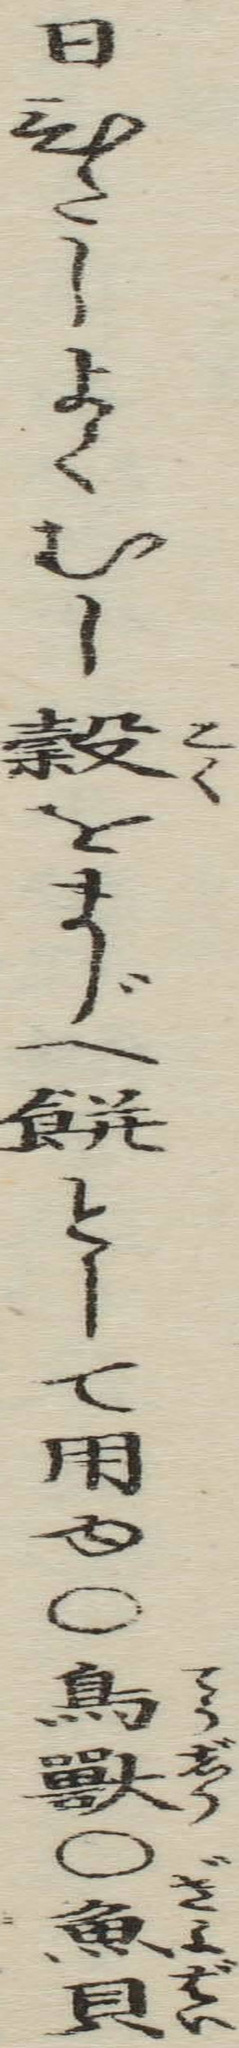日ひたしよくむし穀をまじへ餅として用ゆ○鳥獣○魚貝
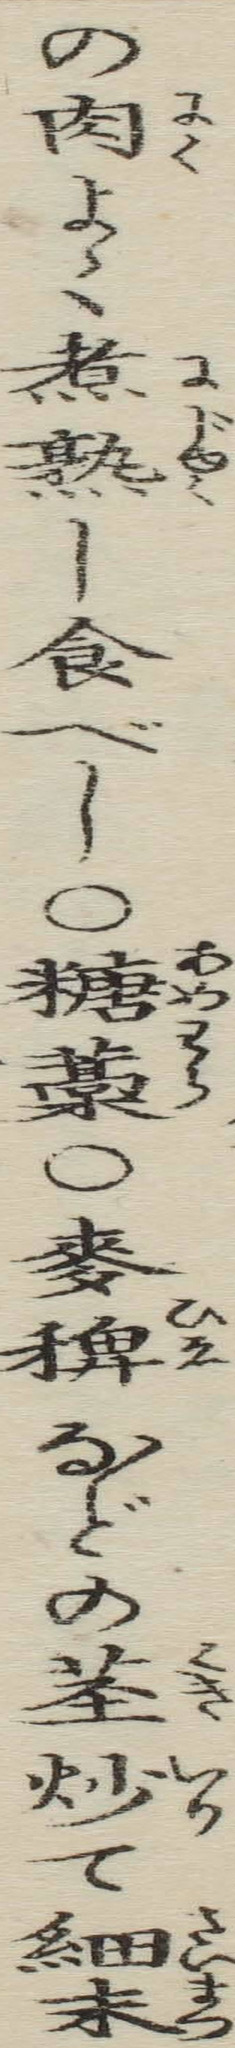の肉よく煮熟し食べし○糖藁○麦稗などの茎炒て細末
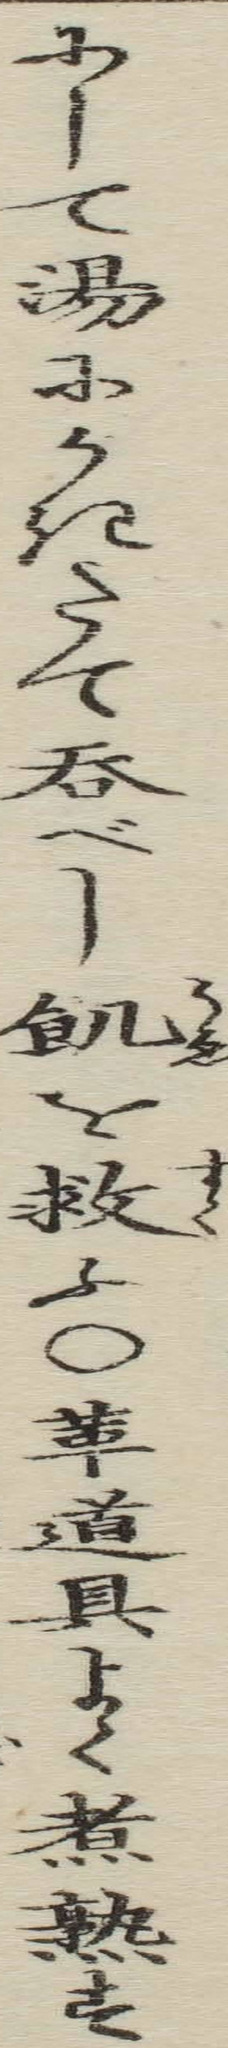にして湯にかきたて呑べし飢を救ふ○革道具よく煮熟す
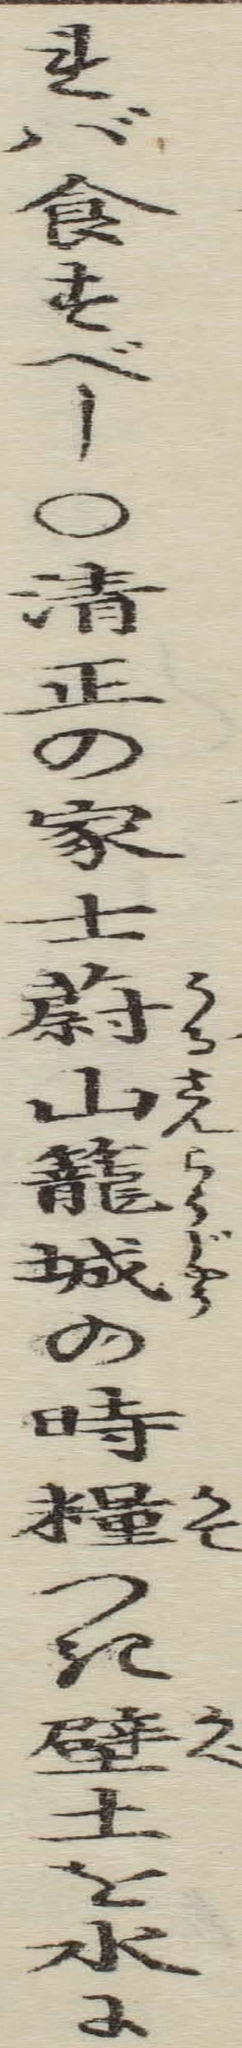れば食すべし○清正の家士蔚山籠城の時糧つき壁土を水に
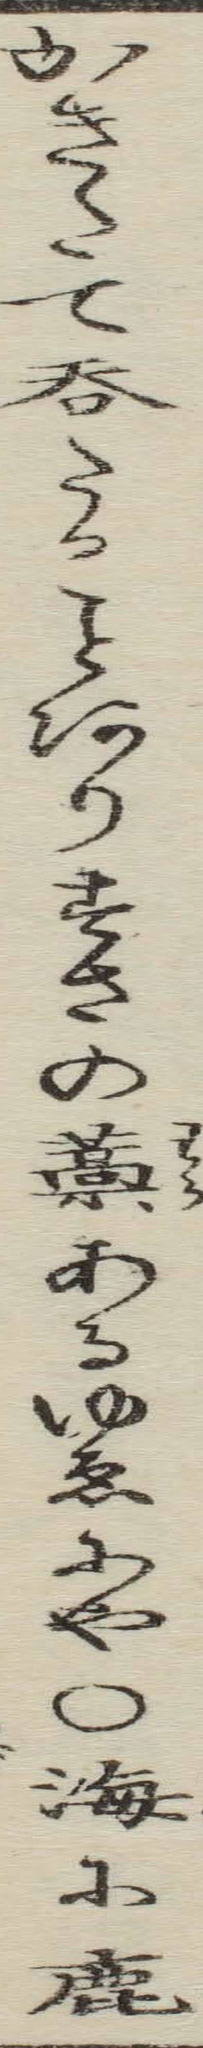かきたて呑たることありすさの藁あるゆゑにや○海に鹿
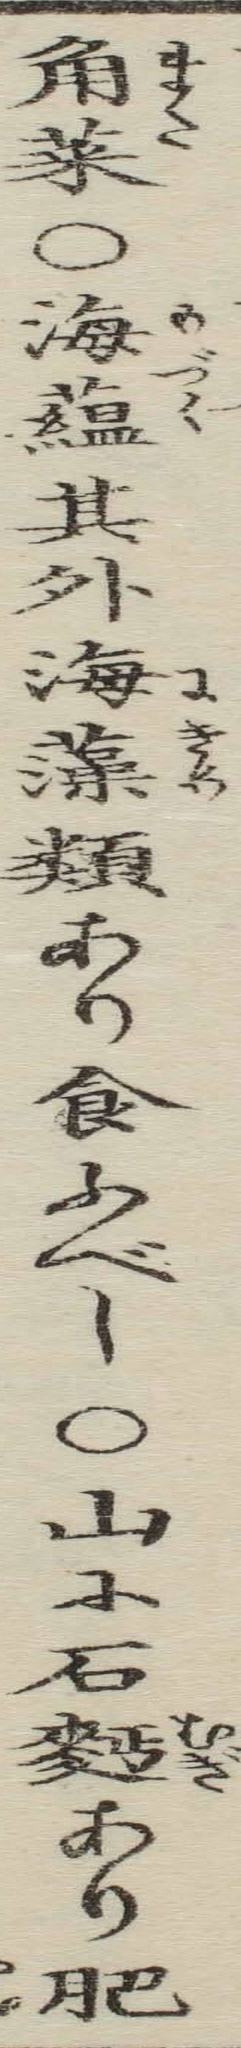角菜○海蘊其外海藻類あり食ふべし○山に石麫あり肥
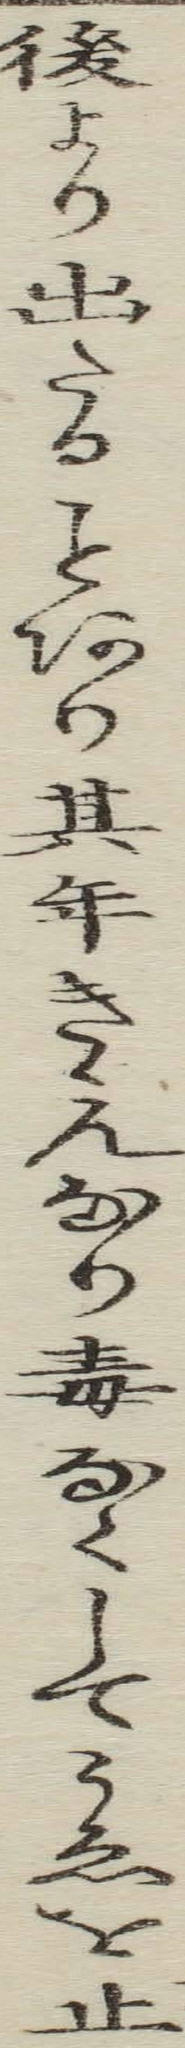後より出たることあり其年きゝんなり毒なくしてうゑを止
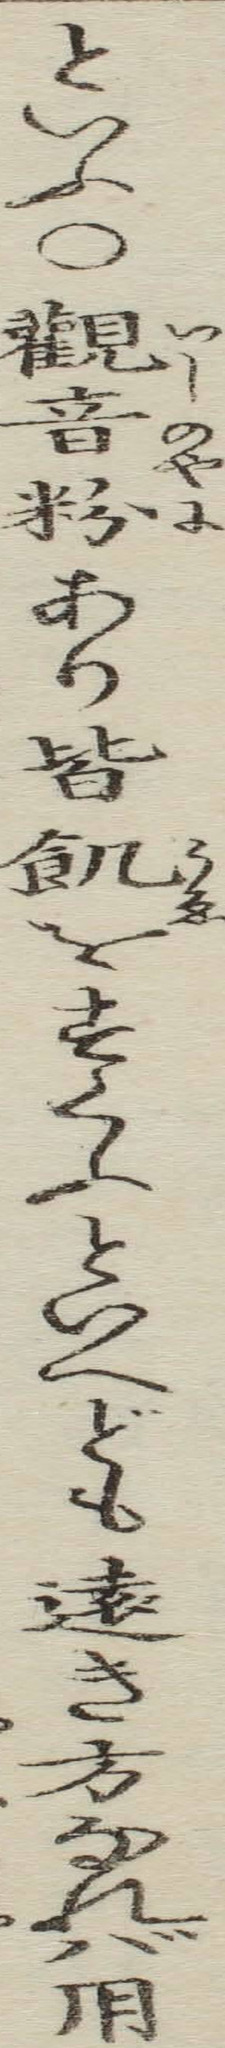といふ○観音粉あり皆飢をすくふといへども遠き方なれば用
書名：救荒便覧
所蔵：国文学研究資料館
